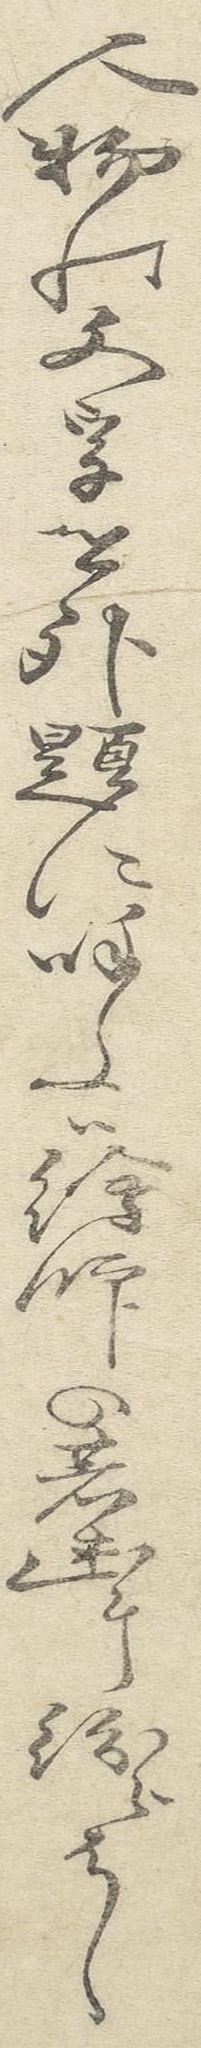人物の文字を外題に呼ふは絵師の著述を紛らはし
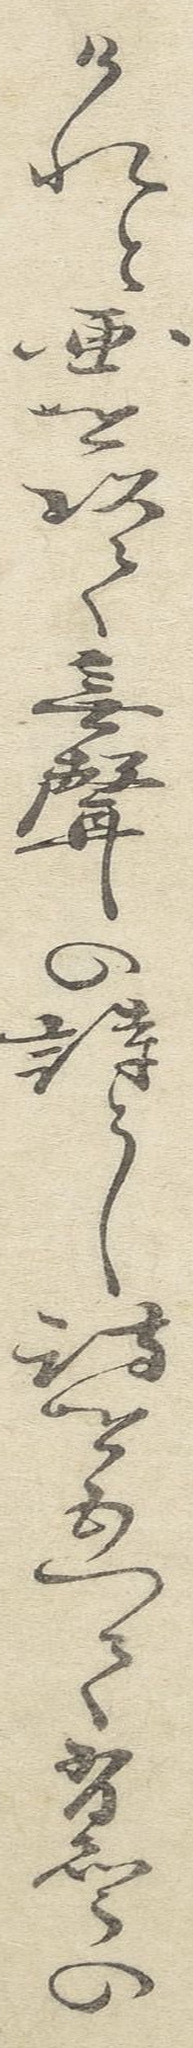けれと画を以て無聲の詩とし詩をもつて有聲の
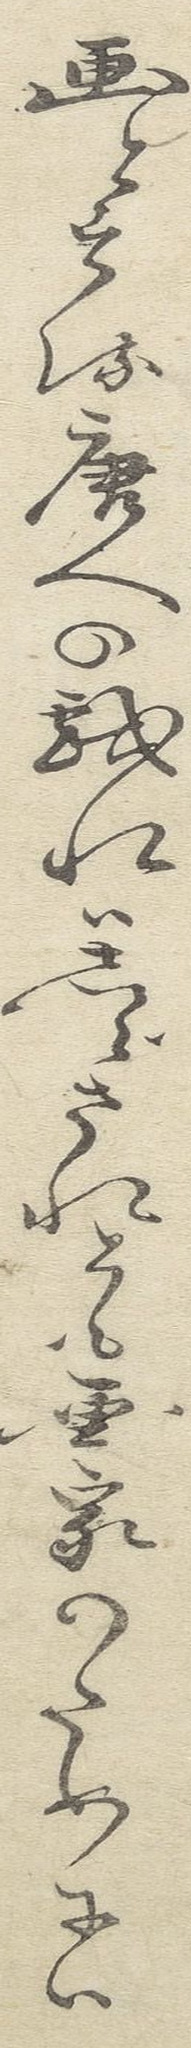画とする唐人之戯れはしらされとも画家のためには
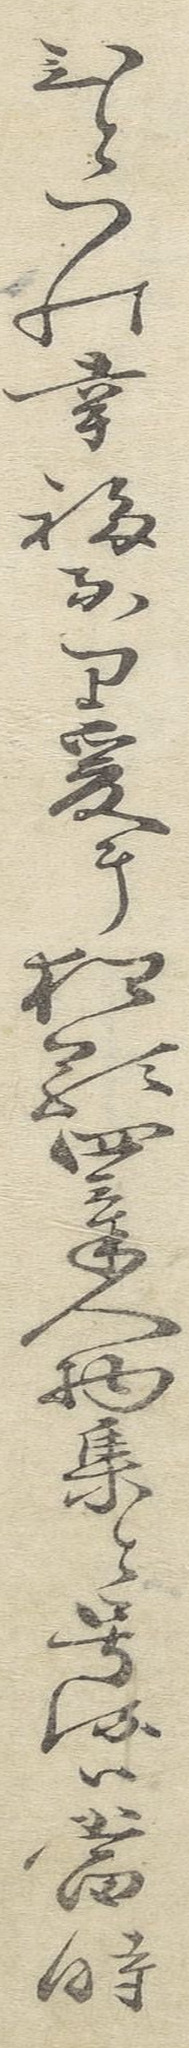ひとつの幸福なり爰を狂類四気人物集と号るは当時
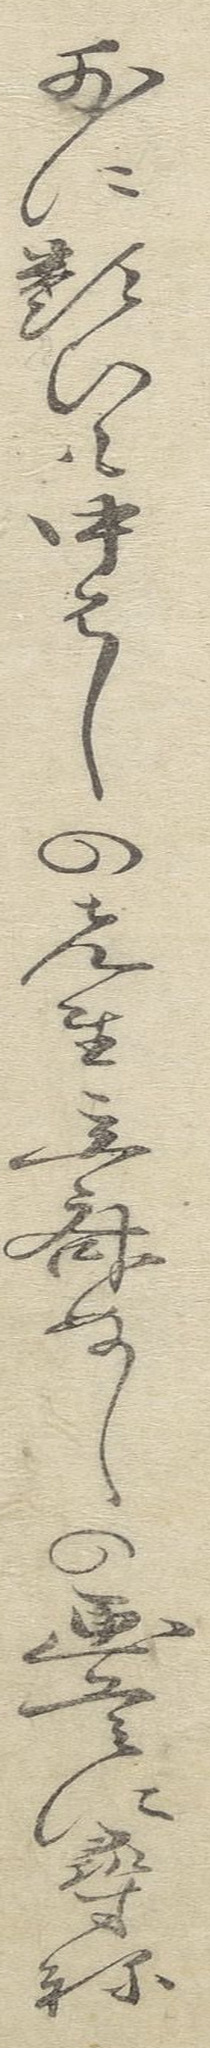外に類ひも中はしの先生宮齊ぬしの画言に尋ね
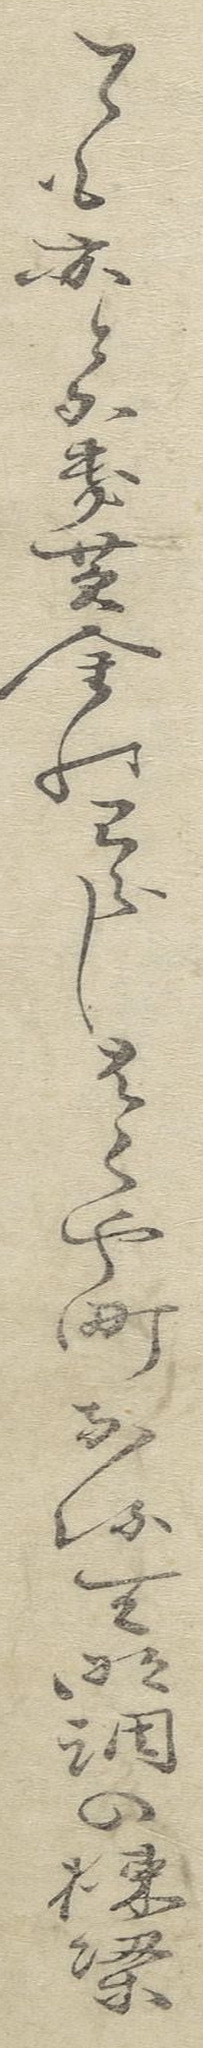ても亦となき黄金のわらしはくや町なる天明調
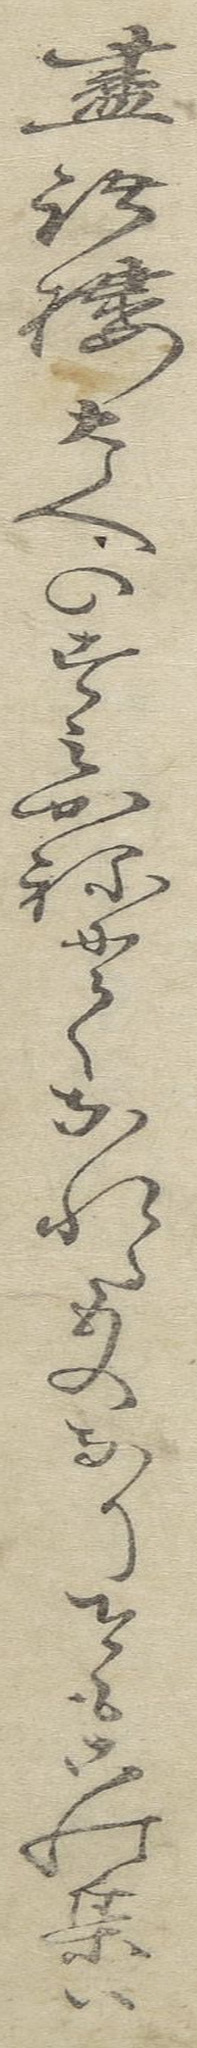盡語楼大人のすみかねにてなれるものなりそもこの集は
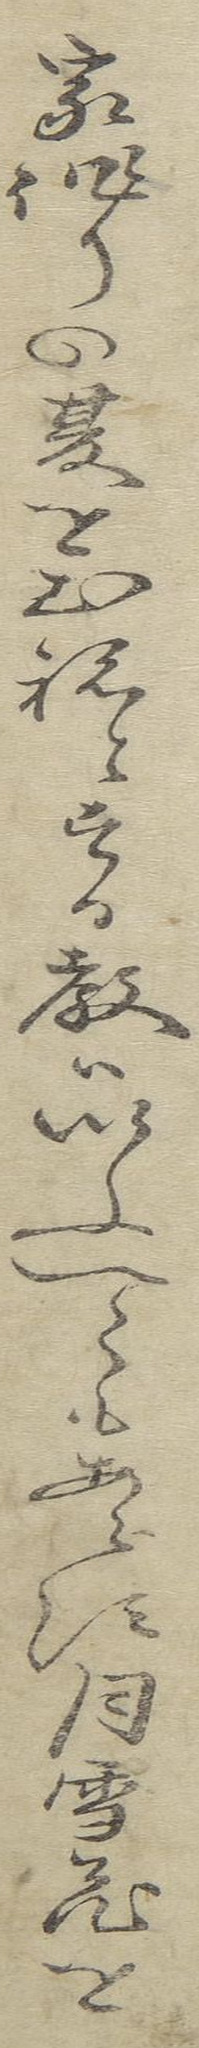家作りの夏をむねとする教はいふへくもあらす月雪花を

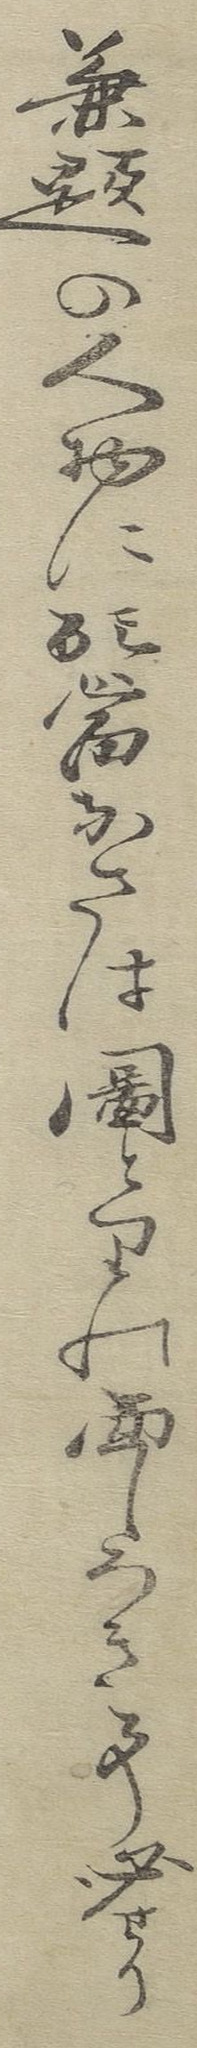兼題の人物に配当なさは図とりの面しろき事必せり
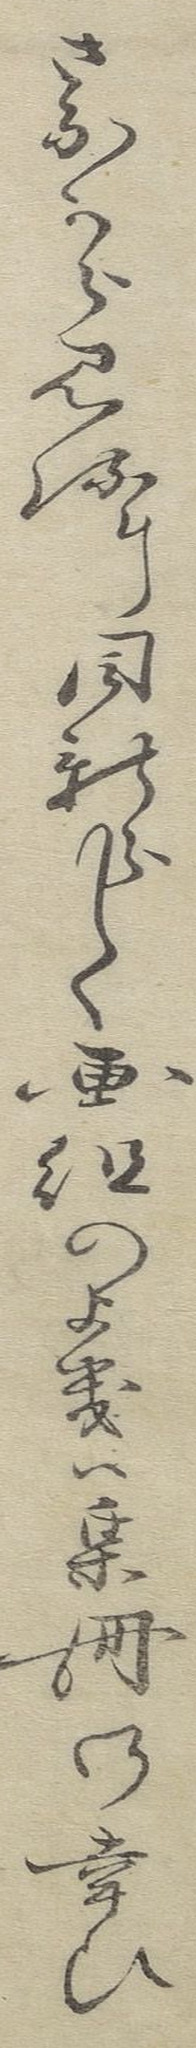さなから見るに目新しく画組のよきは集冊の幸ひ
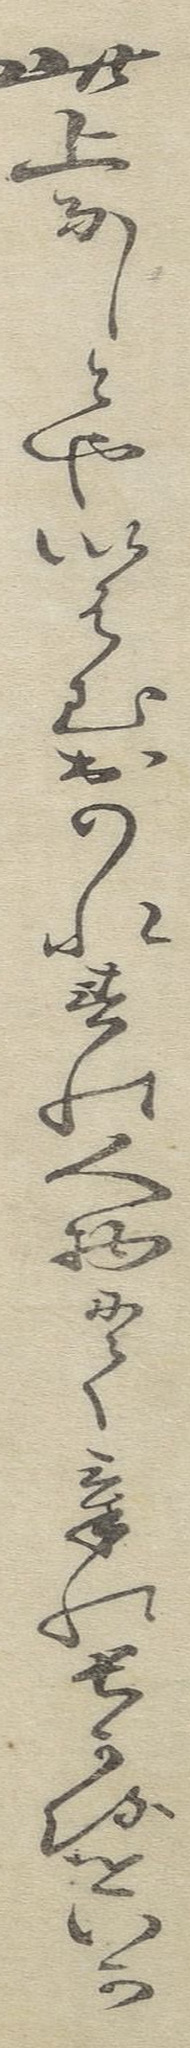此上なしとやいはむおのれ春の人物にて気の長かるをいか
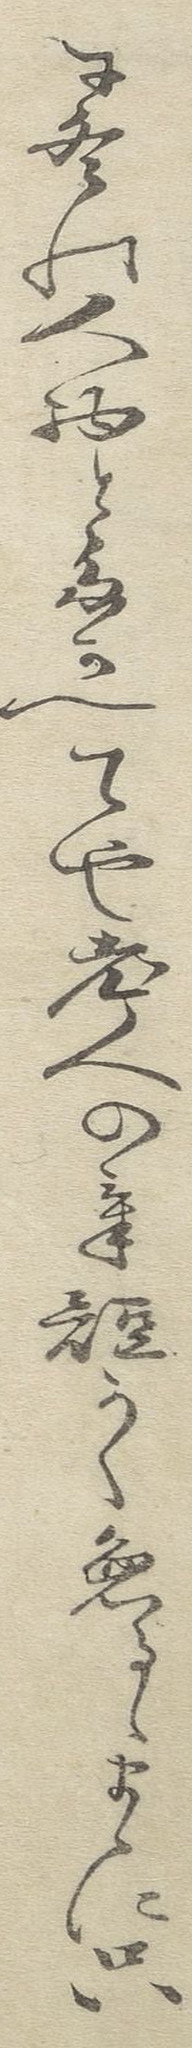に冬の人物とたかへてや老人の気短かく急るゝまゝに只
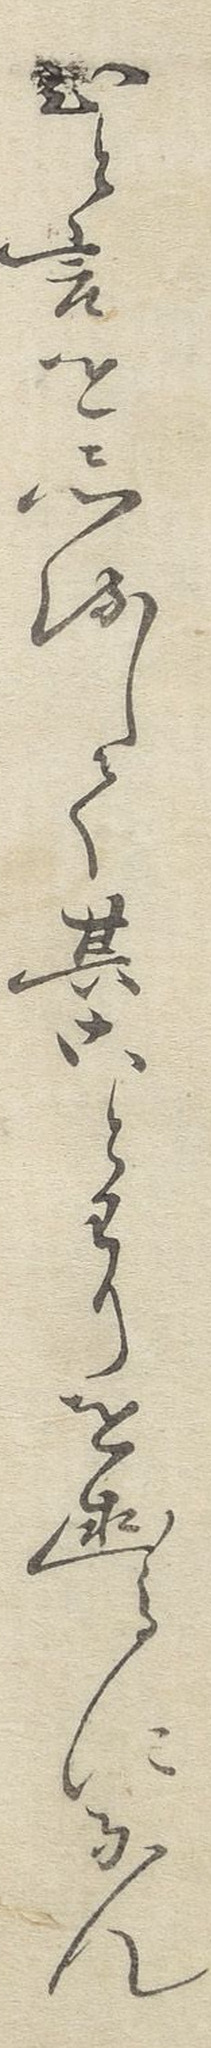ひと言をしるして其ことわりを述るになん
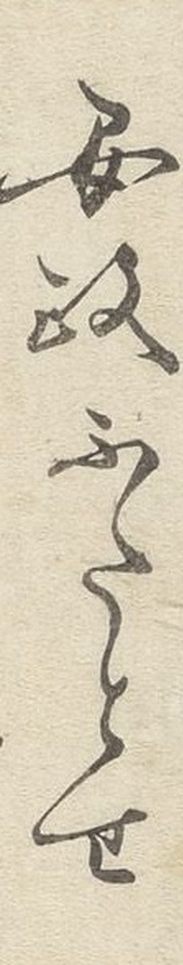安政ふたとせ
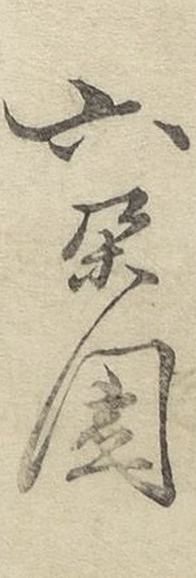六朶園
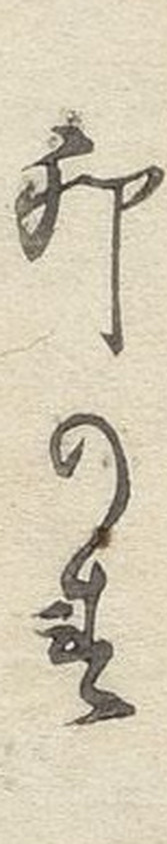卯の春
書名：Picture Album of People with Kyōka (Light Verse) (Kyōka shiki jinbutsu 狂歌四季人物)
